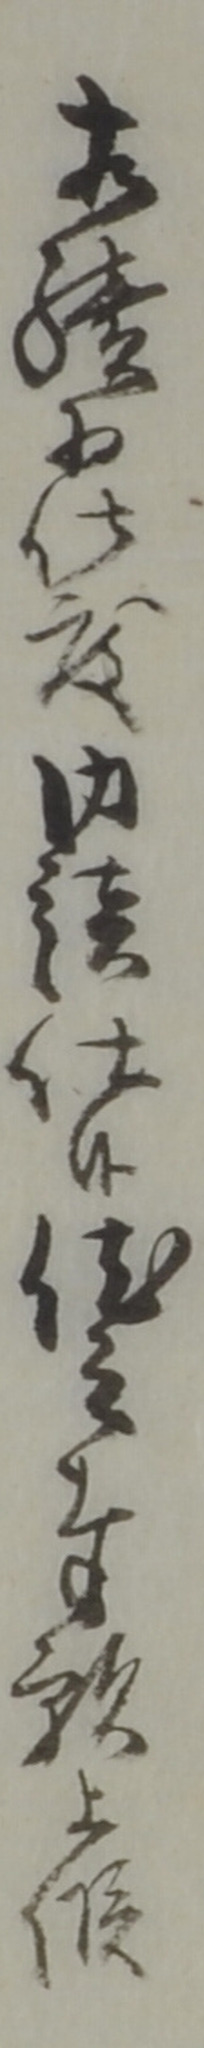相続為仕度内談仕候依之奉願上候
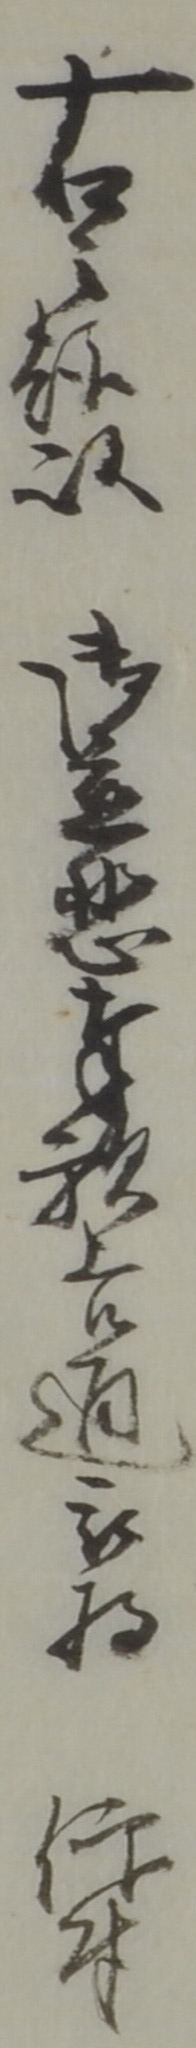右之趣以御慈悲奉願上候通被為仰付
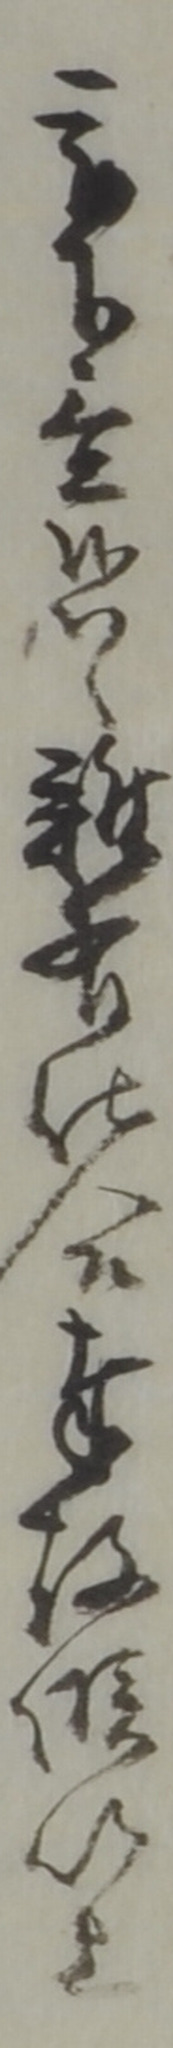被下置候者難有仕合奉存候以上
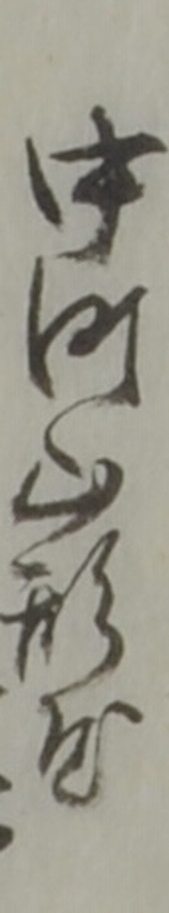中町山形屋
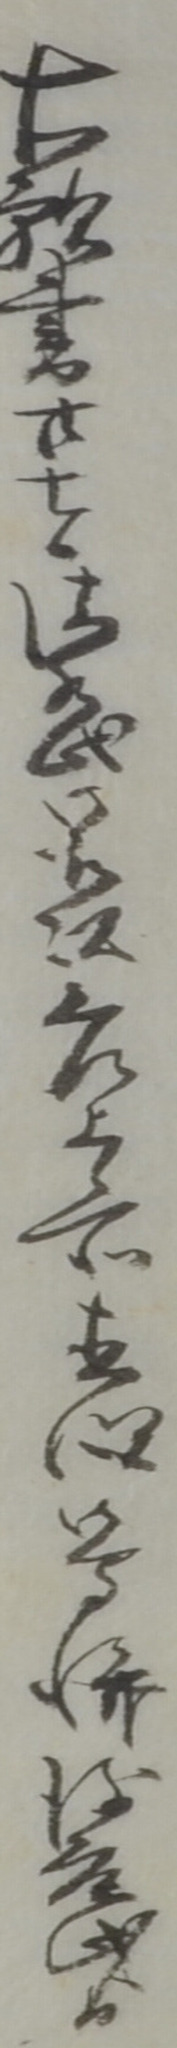右願書廿七日清水氏御取次差上候所直様御聞済後藤氏ゟ
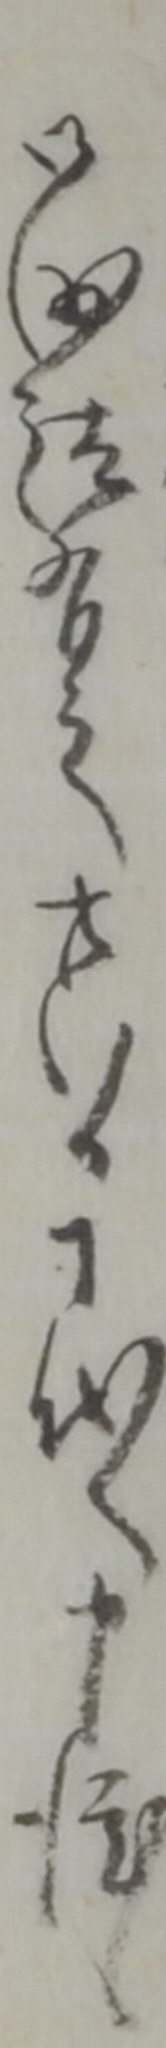御沙汰有之廿八日丁代へ申渡候

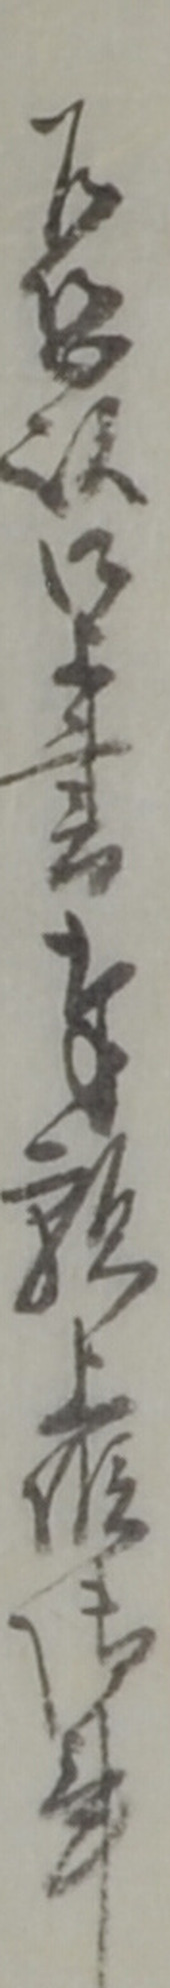乍恐以口上書奉願上候御事
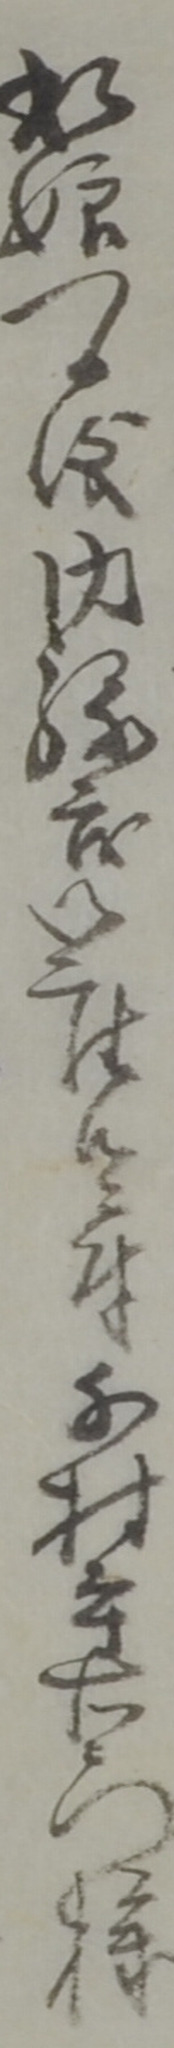私娘つる儀内縁も御座候ニ付千村平右衛門様
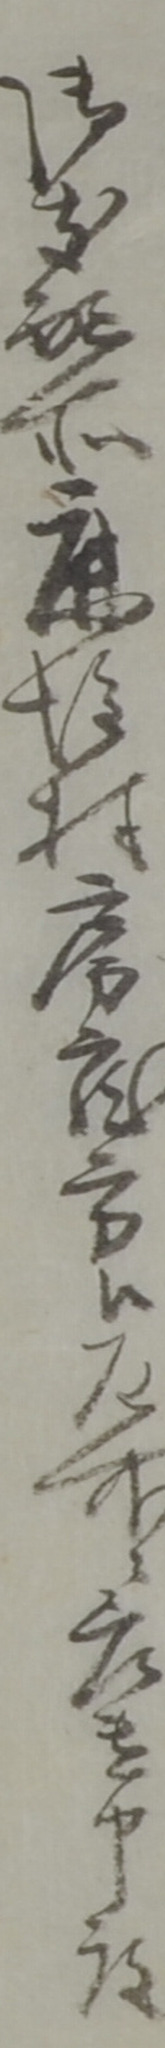御支配所鹿塩村房蔵方江厄介ニ差遣申度
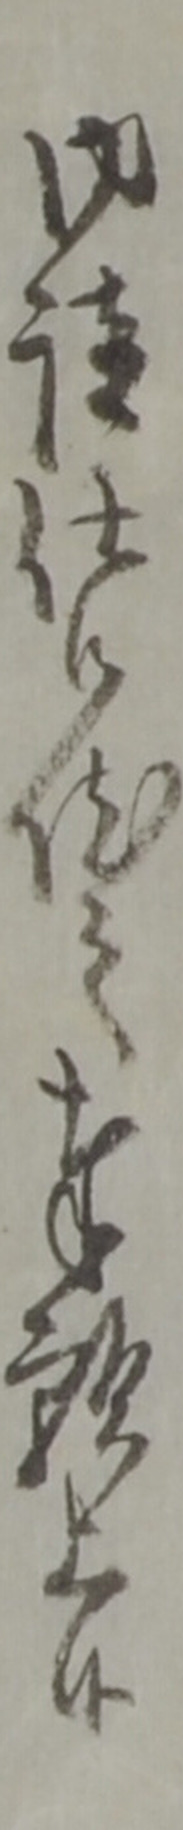内談仕候依之奉願上候
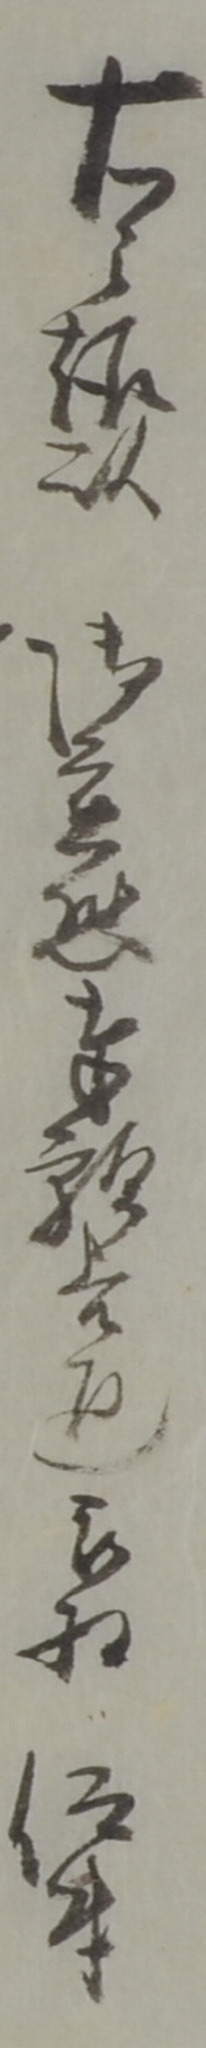右之趣以御慈悲奉願上候通被為仰付
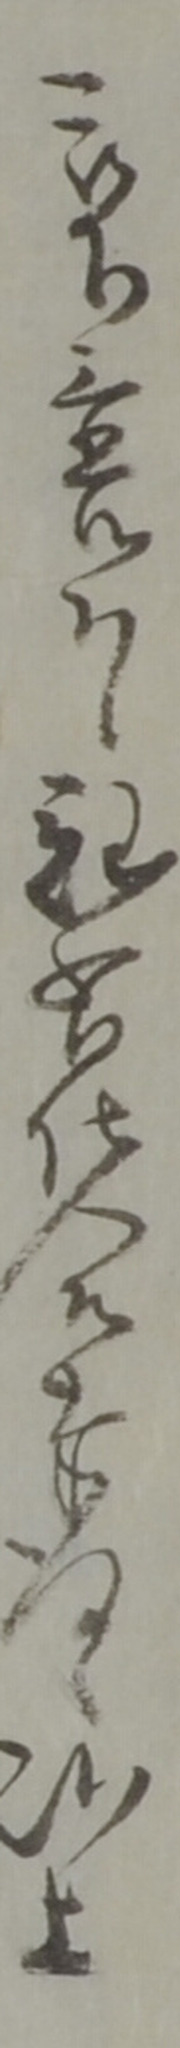被下置候ハヽ難有仕合奉存候以上
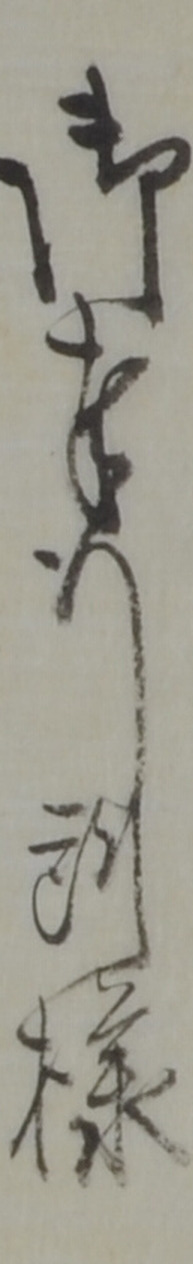御奉行所様
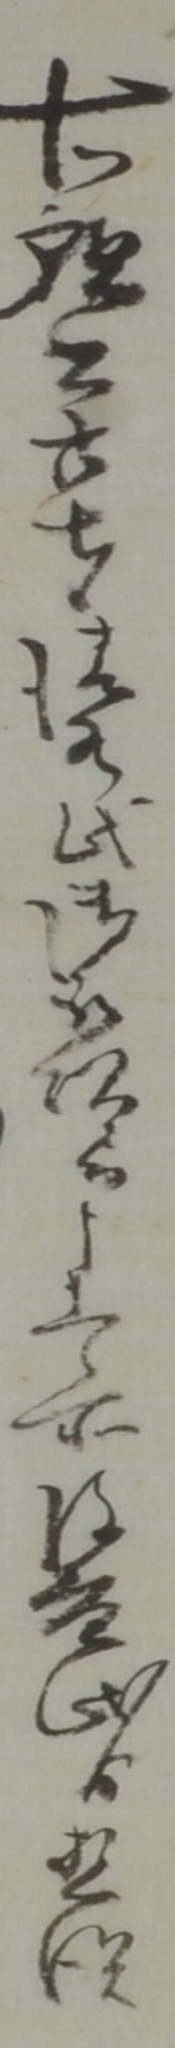右願書廿七日清水氏御取次ニ而申上候所後藤氏ゟ直様
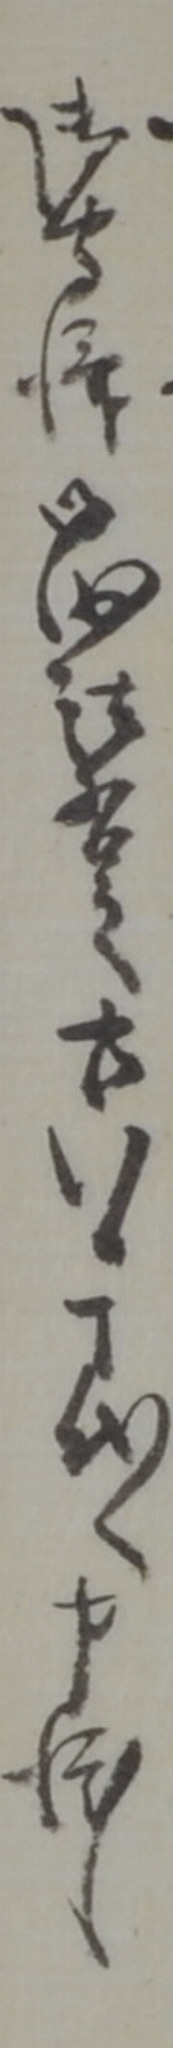御聞済御沙汰有之廿八日丁代へ申渡候
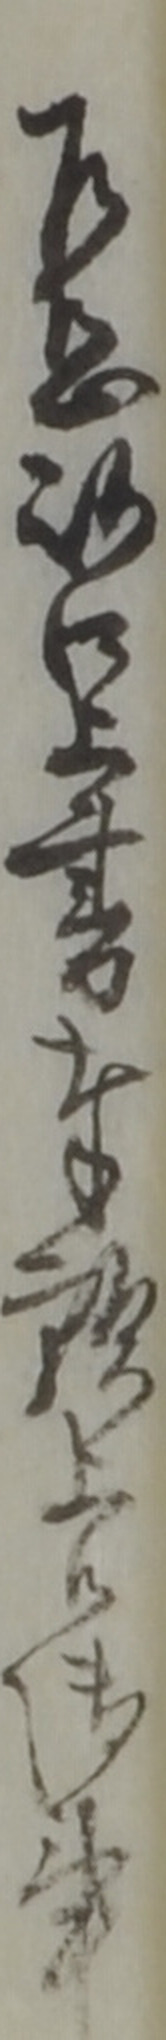乍恐以口上書奉願上候御事
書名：諸願書控簿
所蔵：伊那市立高遠町図書館・合同会社AMANE
